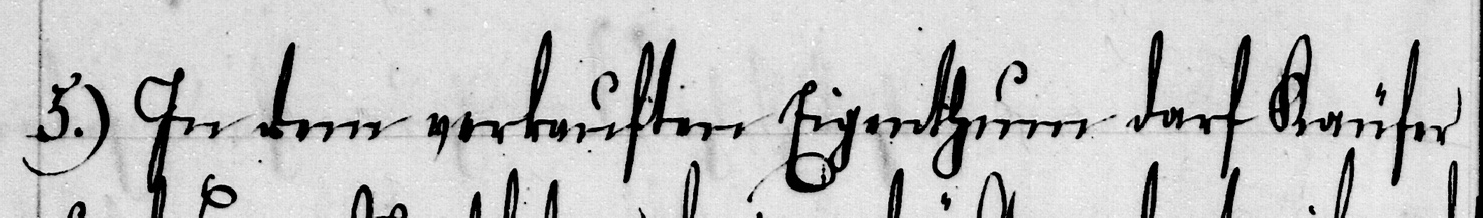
5.) In dem verkauften Eigenthum darf Käufer
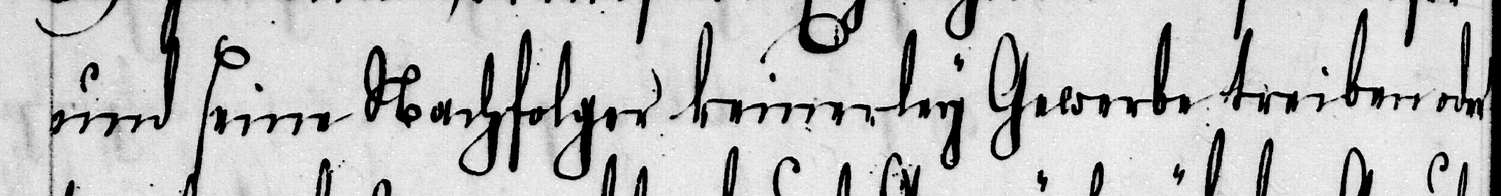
und seine Nachfolger keinerley Gewerbe treiben
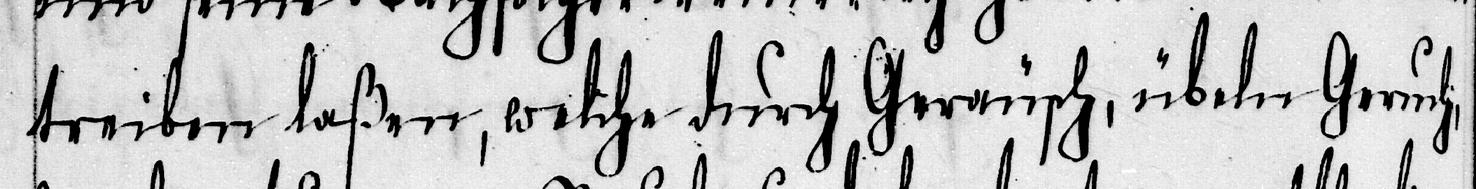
treiben laßen, welche durch Geräusch, übeln Geruc¬
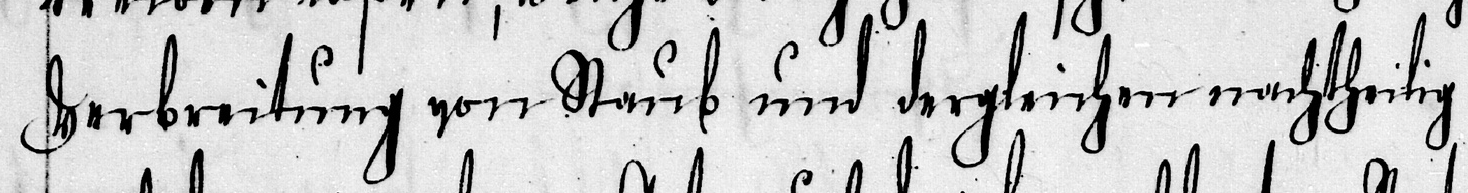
Verbreitung von Staub und dergleichen nachtheilig
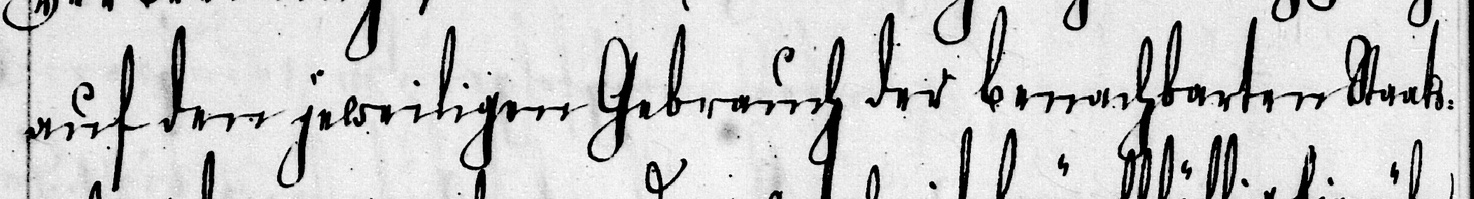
auf den jeweiligen Gebrauch der benachbarten Staa¬
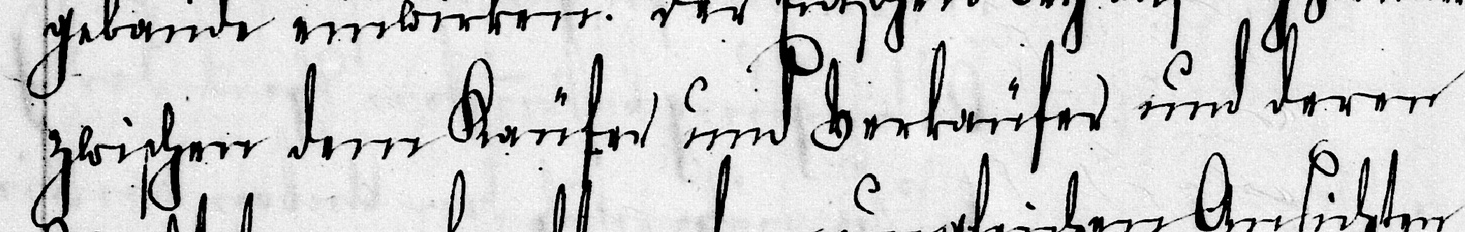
zwischen dem Käufer und Verkäufer und deren
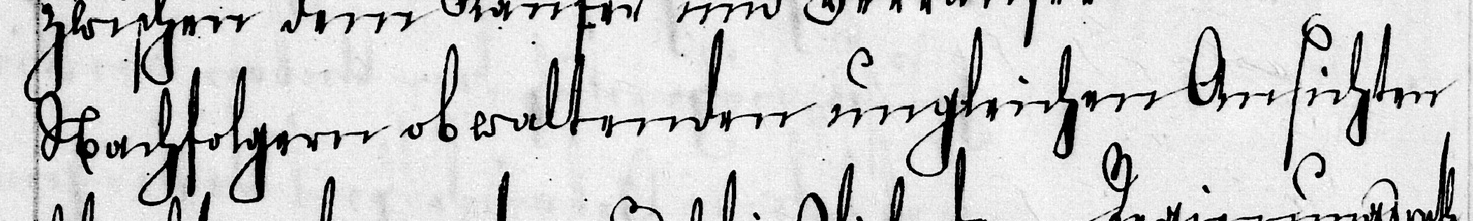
Nachfolgern obwaltenden ungleichen Ansichten
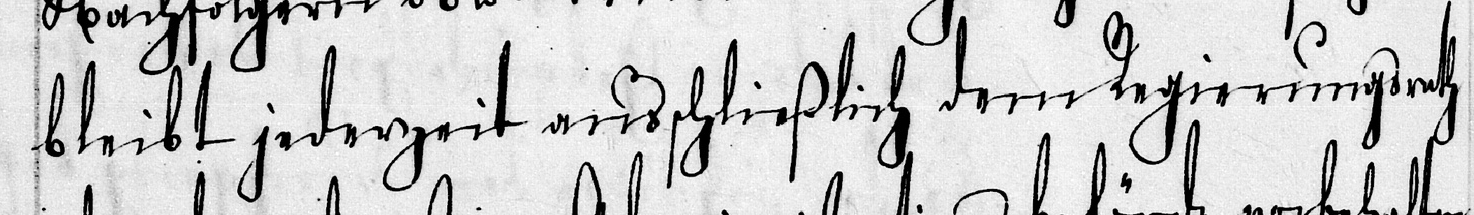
bleibt jederzeit ausschließlich dem Regierungsrath
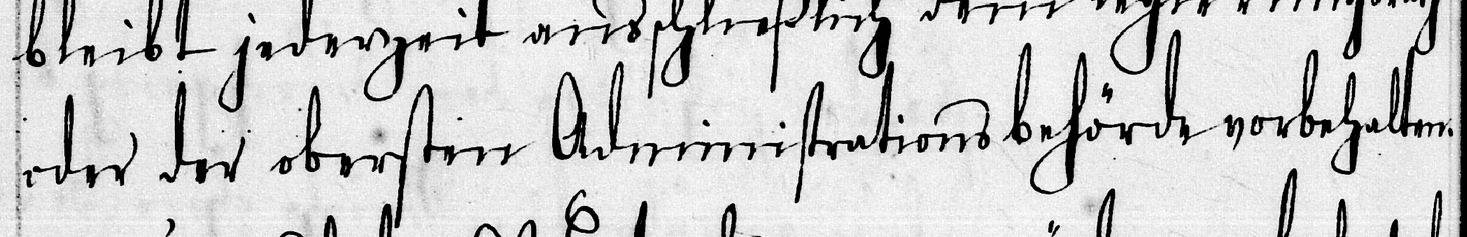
oder der obersten Administrationsbehörde vorbehal¬
